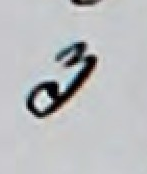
3
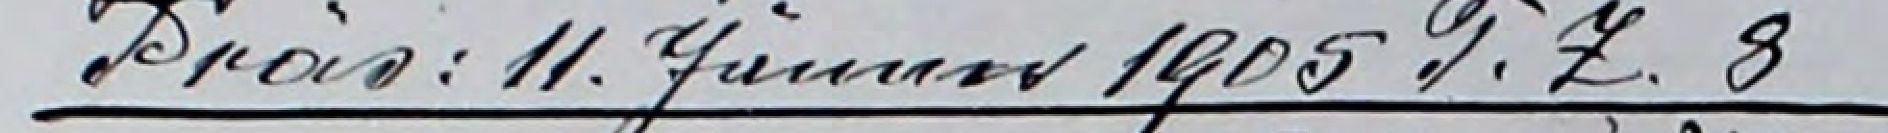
Präs: 11. Jänner 1905 T.Z. 8
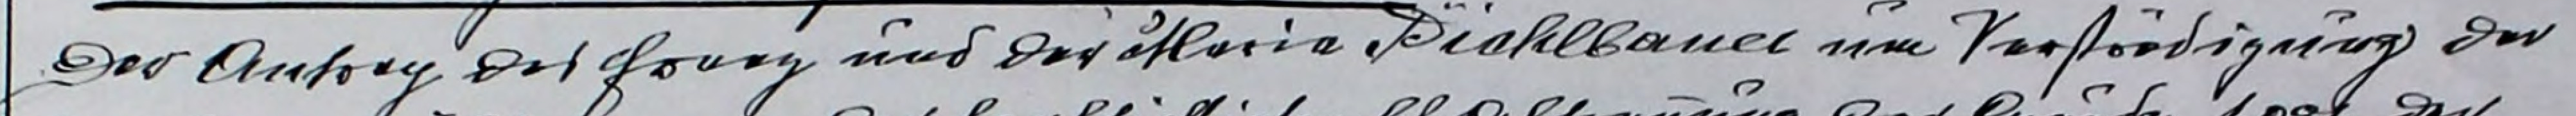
Der Antrag des Franz und der Maria Pichlbauer um Verständigung der
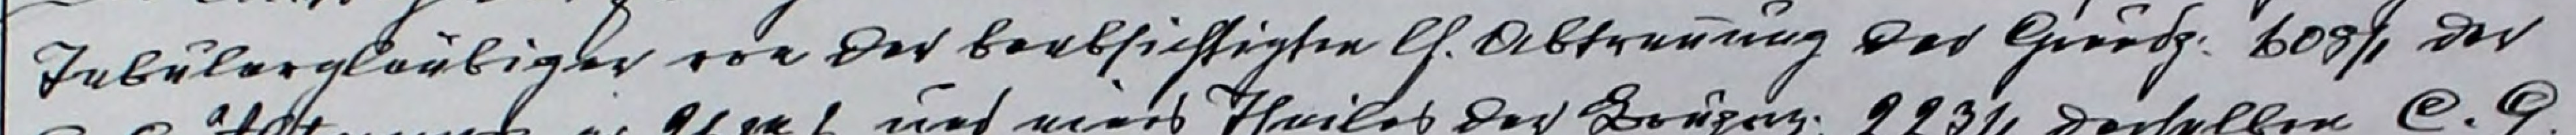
Tabulargläubiger von der beabsichtigten lf. Abtrennung der Grundp: 608/1 der
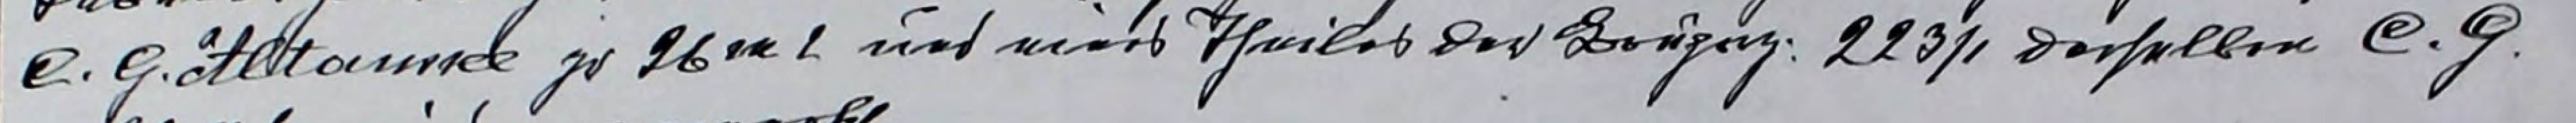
C.G. Altaussee pr 26 ??? 2 und eines Theiles der Bauparz: 223/1 derselben C.G.
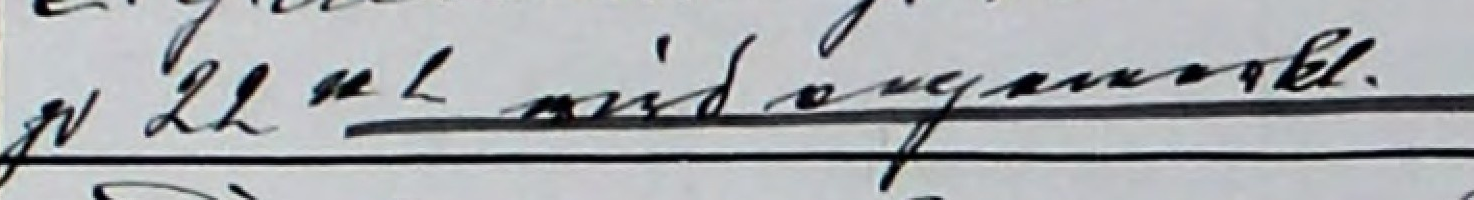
pr 22 wird angemerkt.
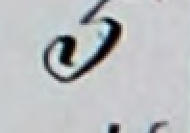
5
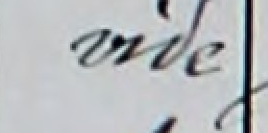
vide
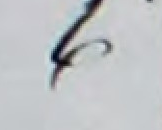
6
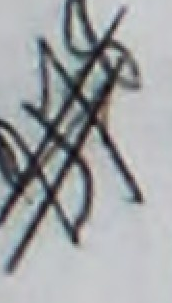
278
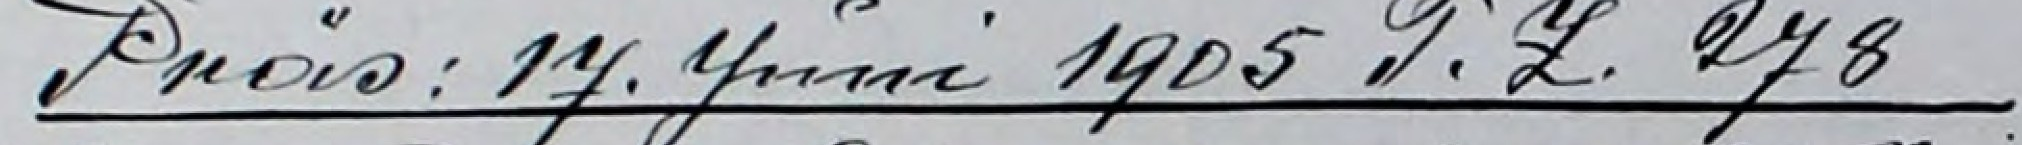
Präs: 17 Juni 1905 T.Z. 278
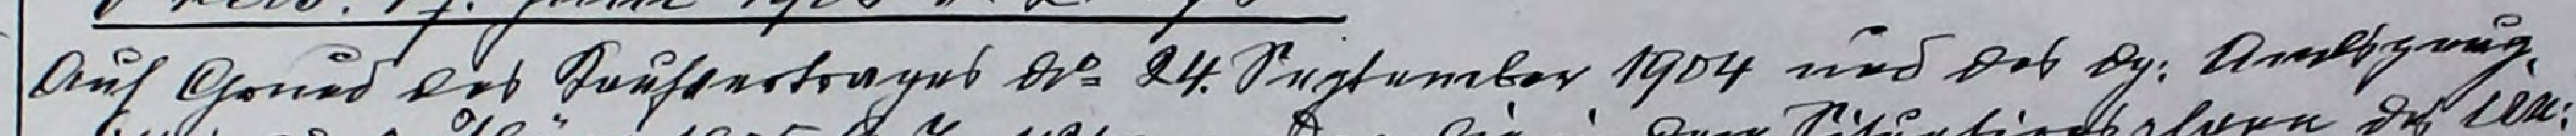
Auf Grund des Kaufvertrages dro 24. September 1904 und des dg: Amtszeug„
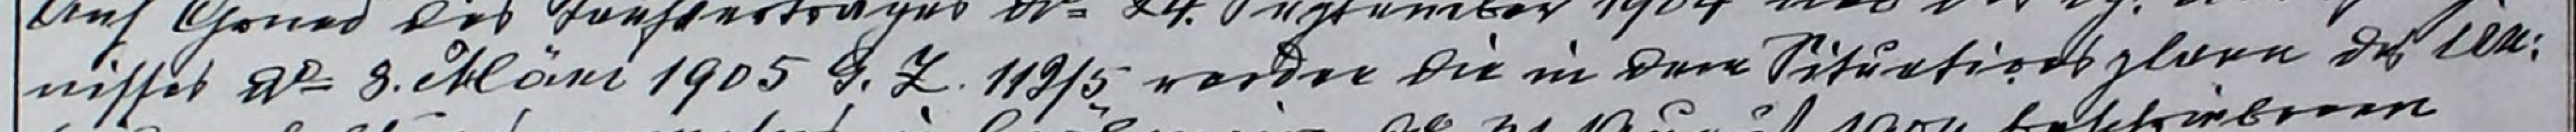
nisse ddo 8. Mäei 1905 G.Z. 112/5 vorder die in dem Situationsplane des ???:
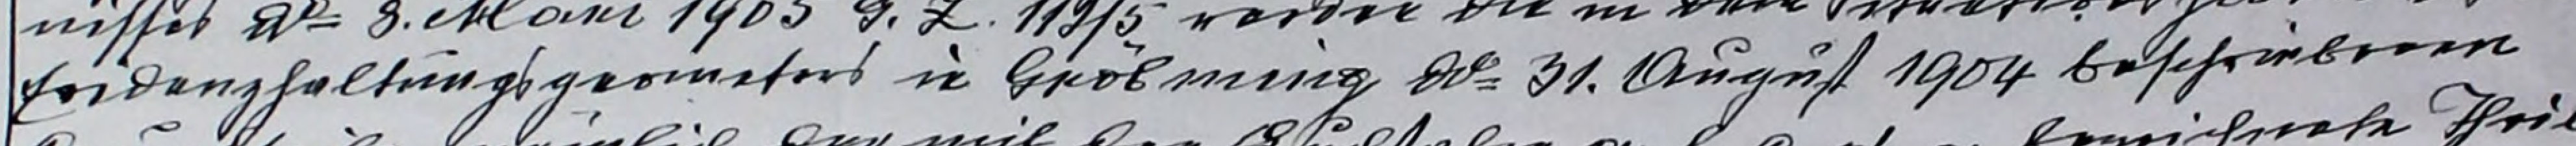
Evidenzhaltungsgeometers in Gröbming ??? 31. August 1904 beschriebenen
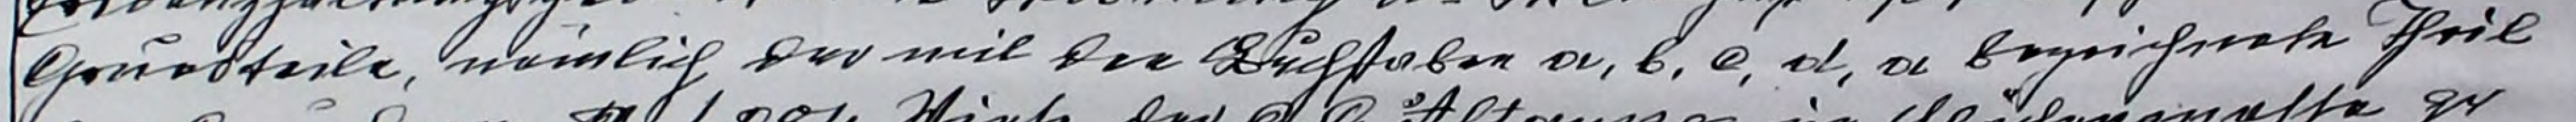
Grundteile, nämlich der mit den Buchstaben a, b, c, d, a bezeichnete Theil
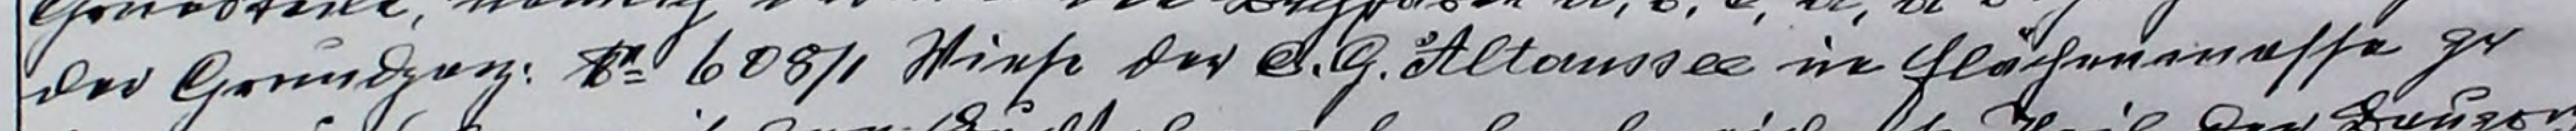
der Grundparz: No 608/1 Wiese der C.G. Altaussee in Flächenmesse pr
